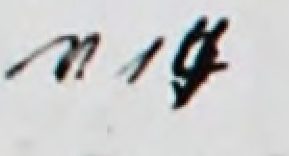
s 14
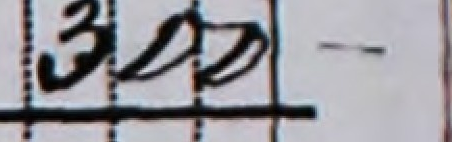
300 –
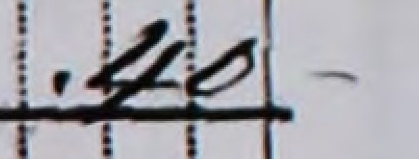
40 –
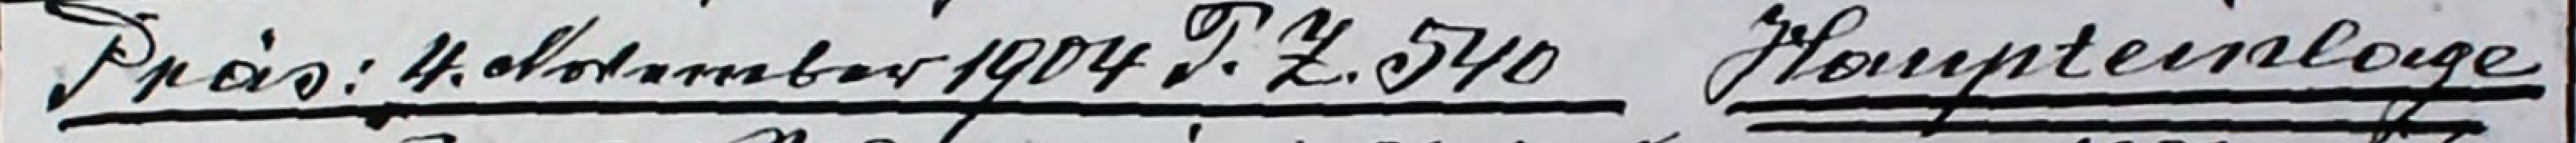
Präs: 4. November 1904 T.Z. 540 Haupteinlage
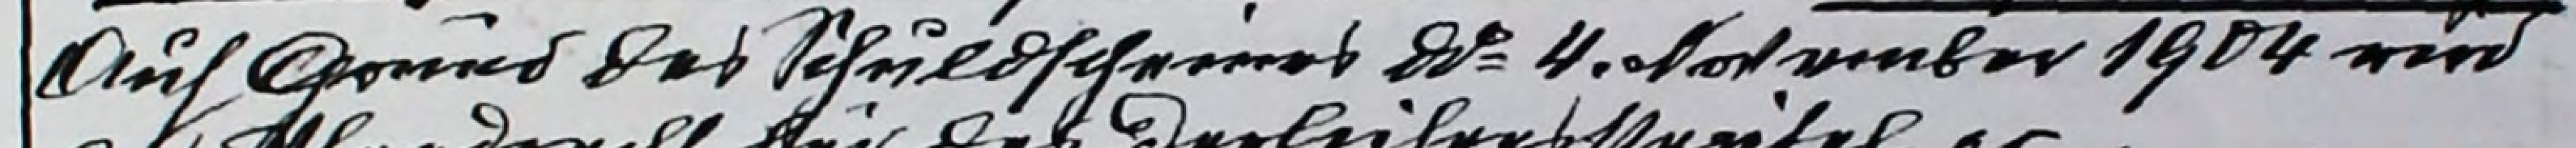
Auf Grund des Schuldscheines ddo 4. November 1904 wird
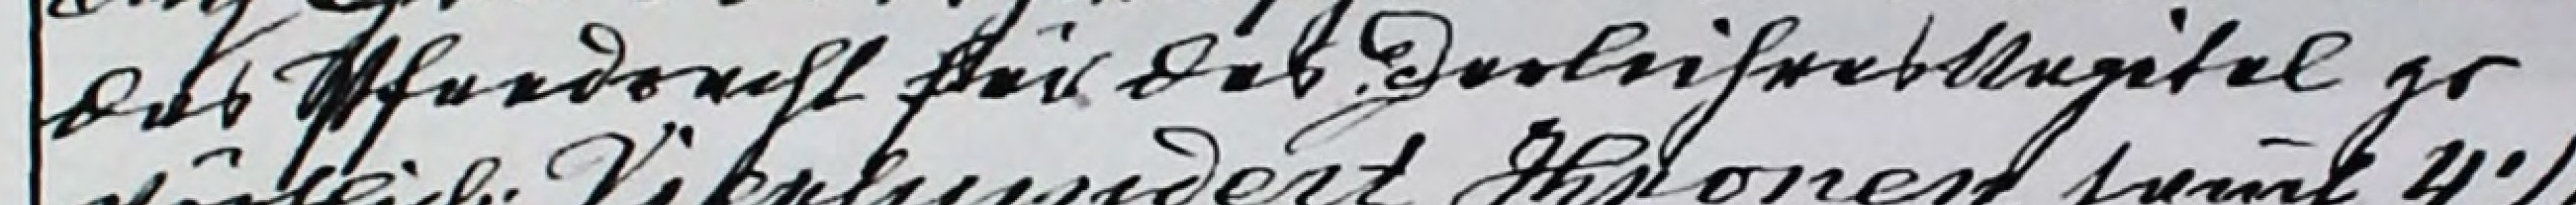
das Pfandrecht für des Darleihenskapital pr
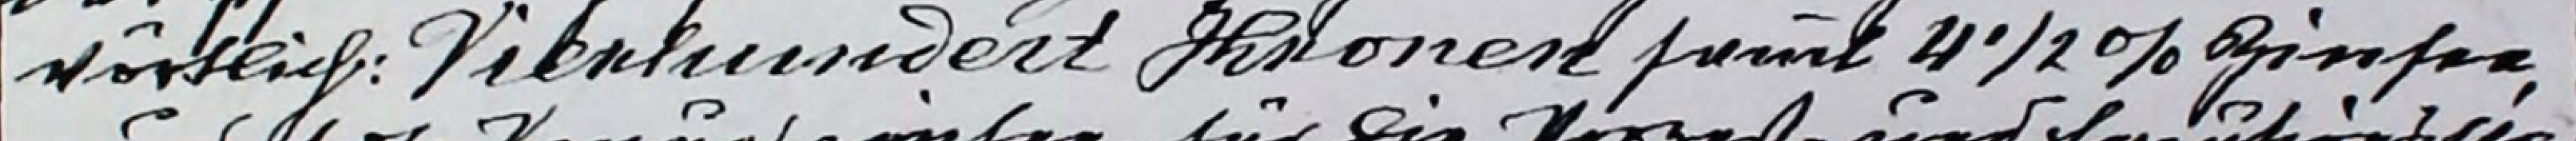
wörtlich: Vierhundert Kronen sammt 4 1/2 % Zinsen,
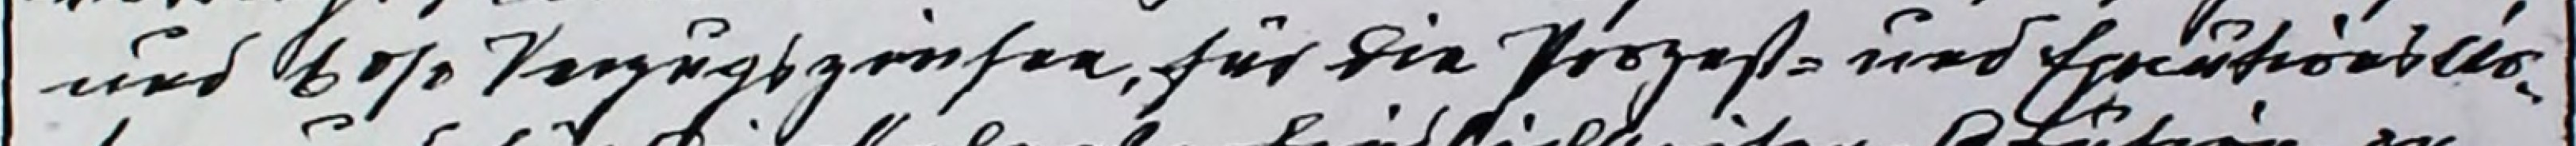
und 6 ^ Verzugszinsen, für die Prozest= und Executionska=
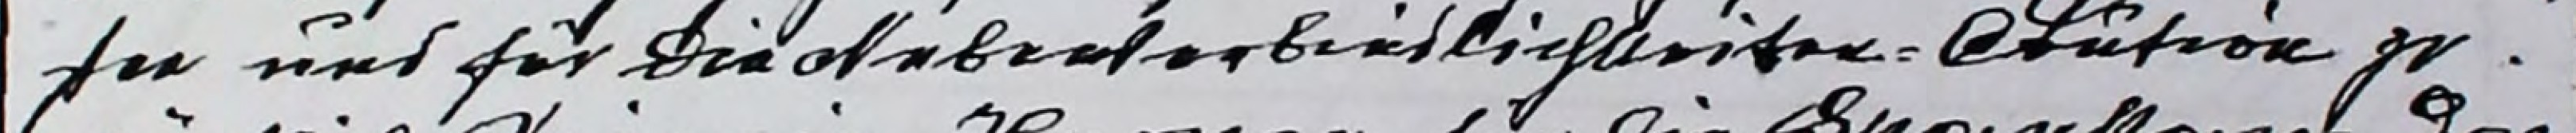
sten und für die Nebenverbindlichkeiten = Caution pr
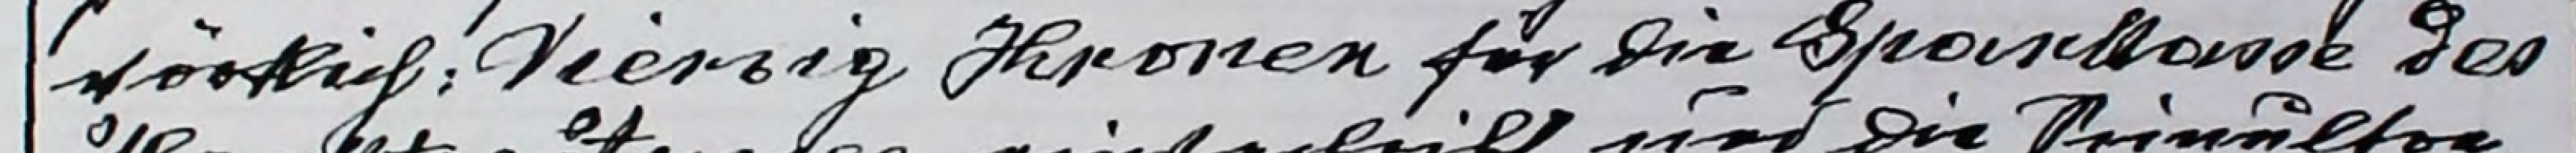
wörtlich: Vierzig Kronen für die Sparkasse des
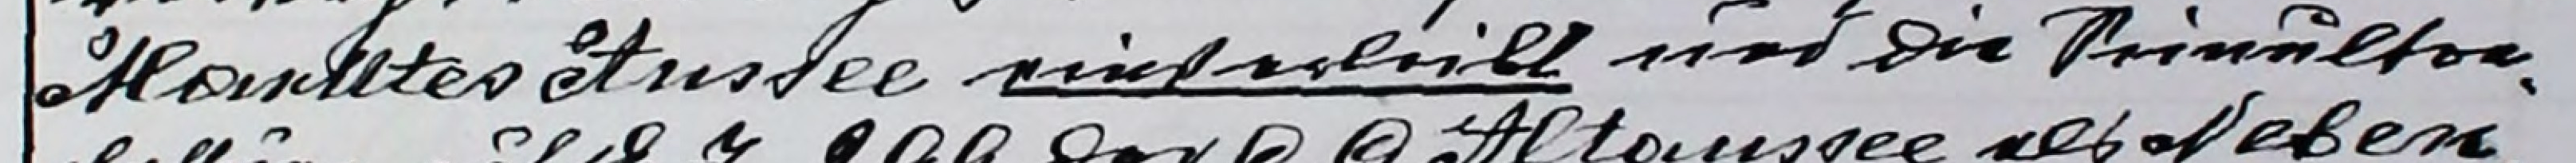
Marktes Aussee einverleibt und die Simultan„
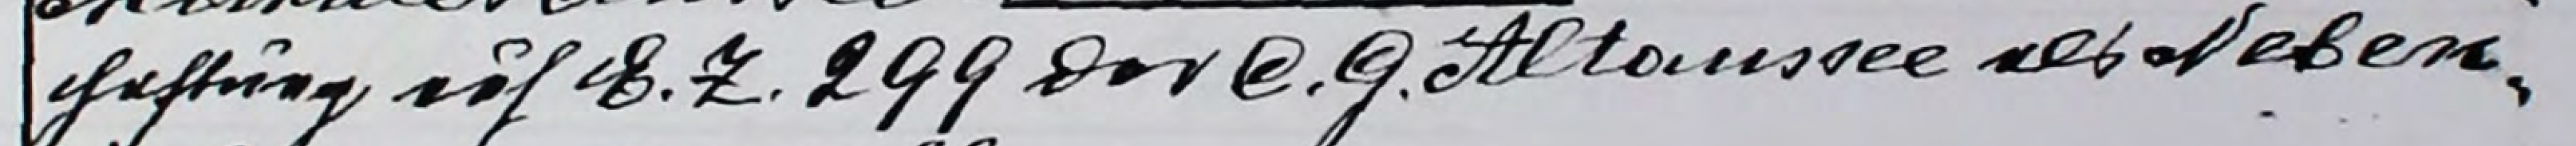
haftung auf E.Z. 299 der C.G. Altaussee als Neben„
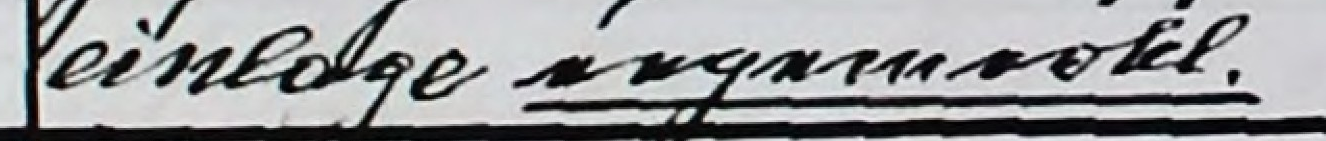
einlage angemerkt.
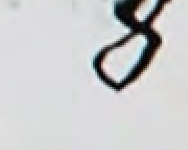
8
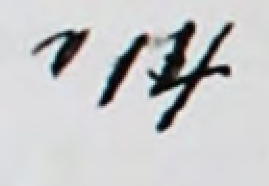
s 14
